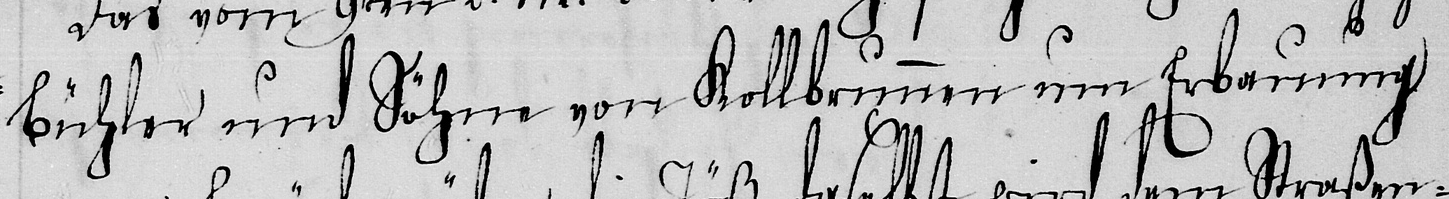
Bühler und Söhne von Kollbrunnen um Erbauung
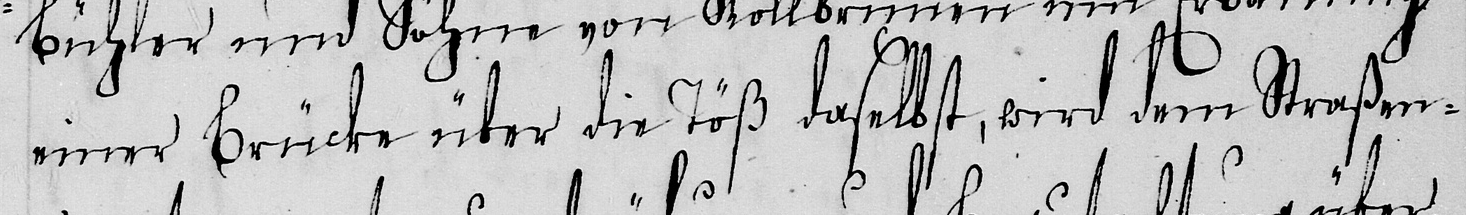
einer Brücke über die Töß daselbst, wird dem Straße¬
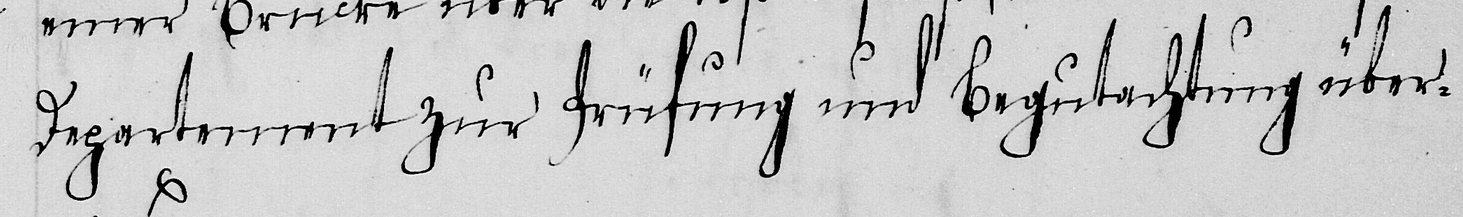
epartement zur Prüfung und Begutachtung über¬
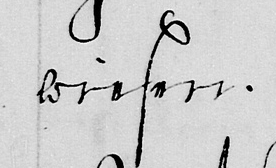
wiesen.
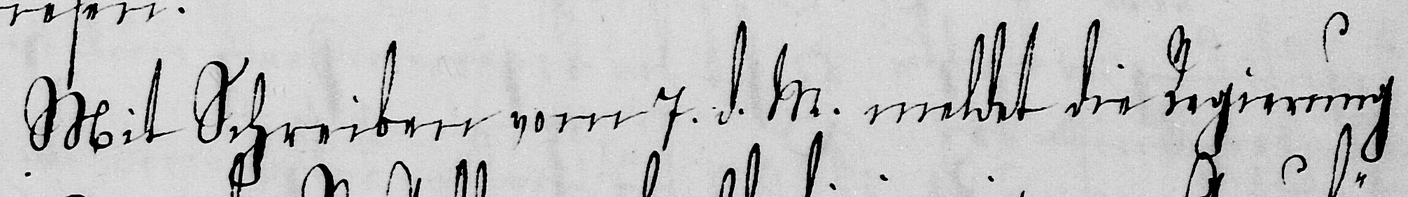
Mit Schreiben vom 7. d. M. meldet die Regierung
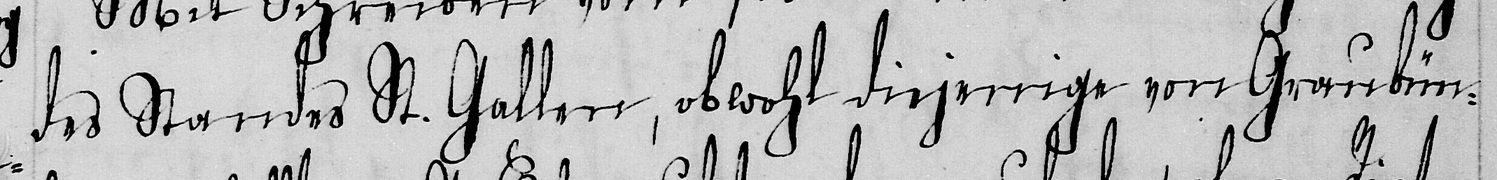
des Standes St. Gallen, obwohl diejenige von Graubün¬
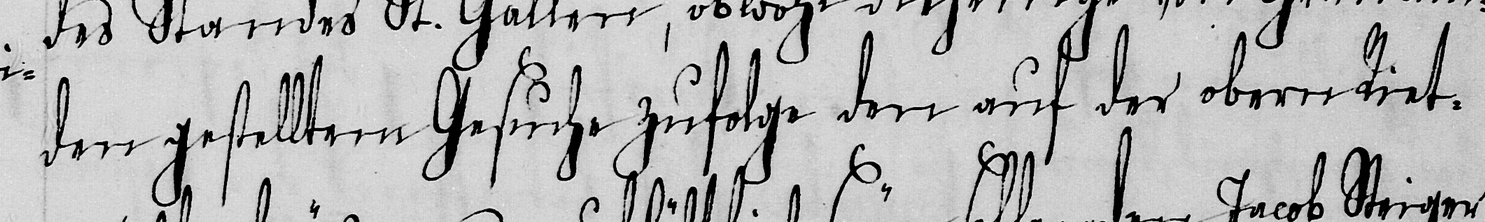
den gestelltem Gesuche zufolge den auf der obern Riet¬
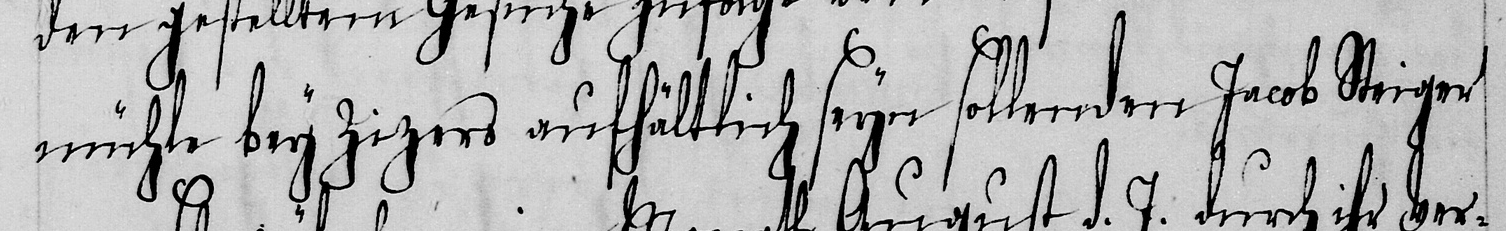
mühle bey Zizers aufhältlich seyn sollenden Jacob Steiger
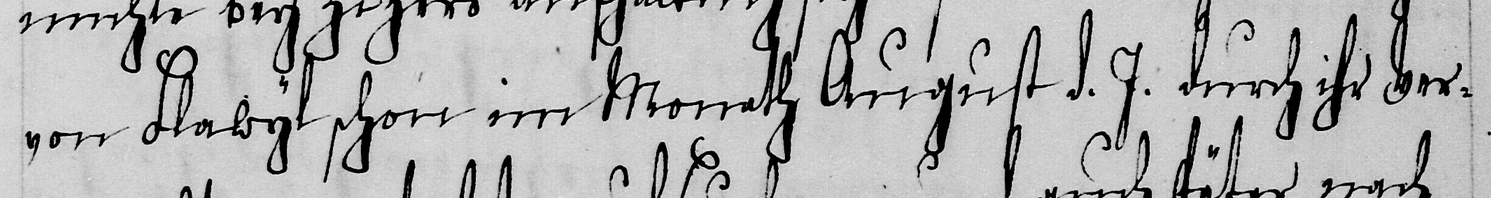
von Flawyl schon im Monath August d. J. durch ihr Ver¬
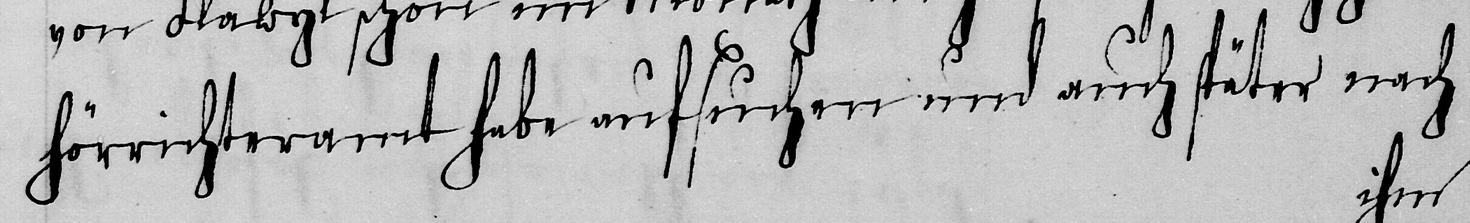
hörrichteramt habe aufsuchen und auch später nach
